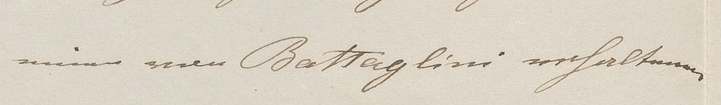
einen von Battaglini erhaltenen
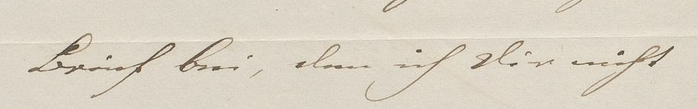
Brief bei, den ich Dir nicht
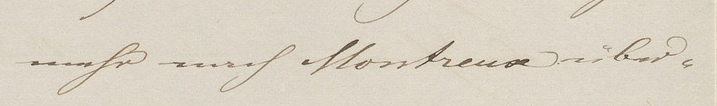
mehr nach Montreux über-
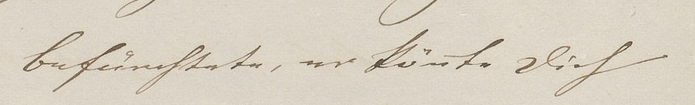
befürchtete, er könnte Dich
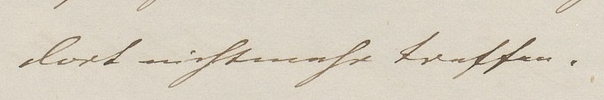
dort nicht mehr treffen.
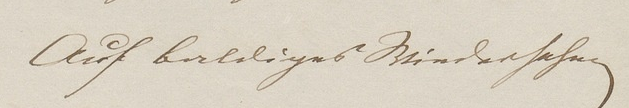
Auf baldiges Wiedersehen
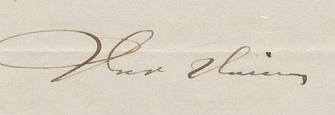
Der Deine
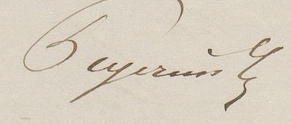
Peyer im Hof
